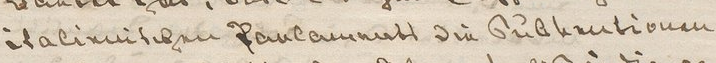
italienischen Parlaments die Subventionen
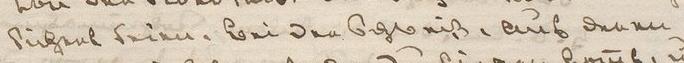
sichert seien. Bei der Schweiz, auf deren
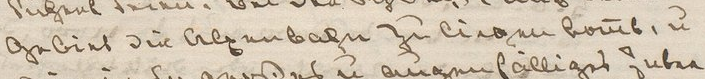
Gebiet die Alpenbahn zu liegen kommt, u
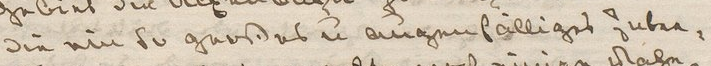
die ein so großes u augenfälliges Inter-
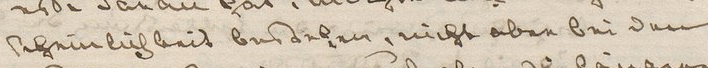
scheinlichkeit bestehen, nicht aber bei den
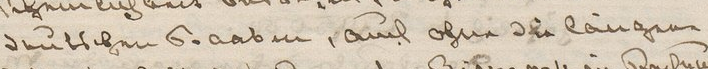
deutschen Staaten, auch ohne die längere
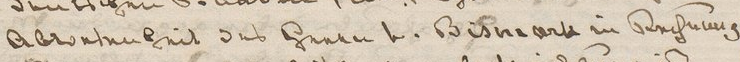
Abwesenheit des Herrn v. Bismark in Rechnung
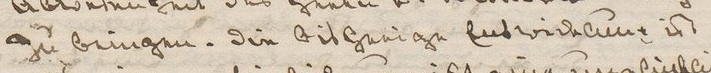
zu bringen. Die bisherige Entwicklung ist
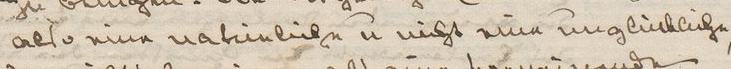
also eine natürliche u nicht eine unglückliche,
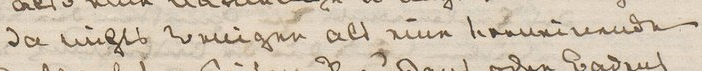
da nichts weniger als eine verneinende
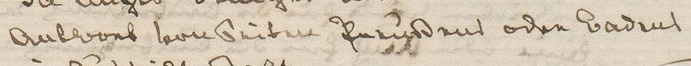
Antwort von Seiten Preußens oder Badens
